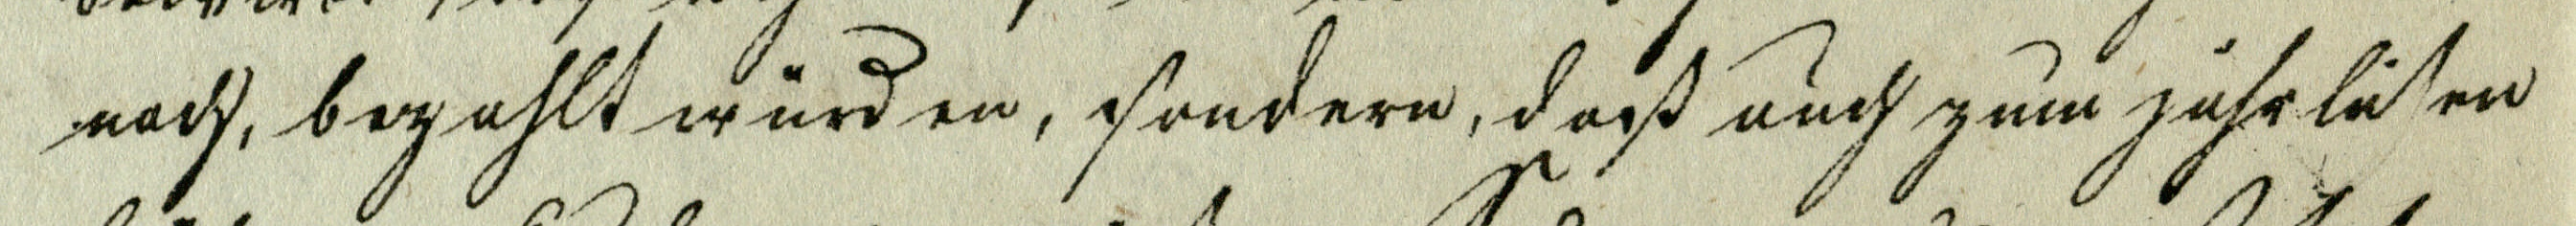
nach, bezahlt würden, sondern, daß auch zum jährlichen
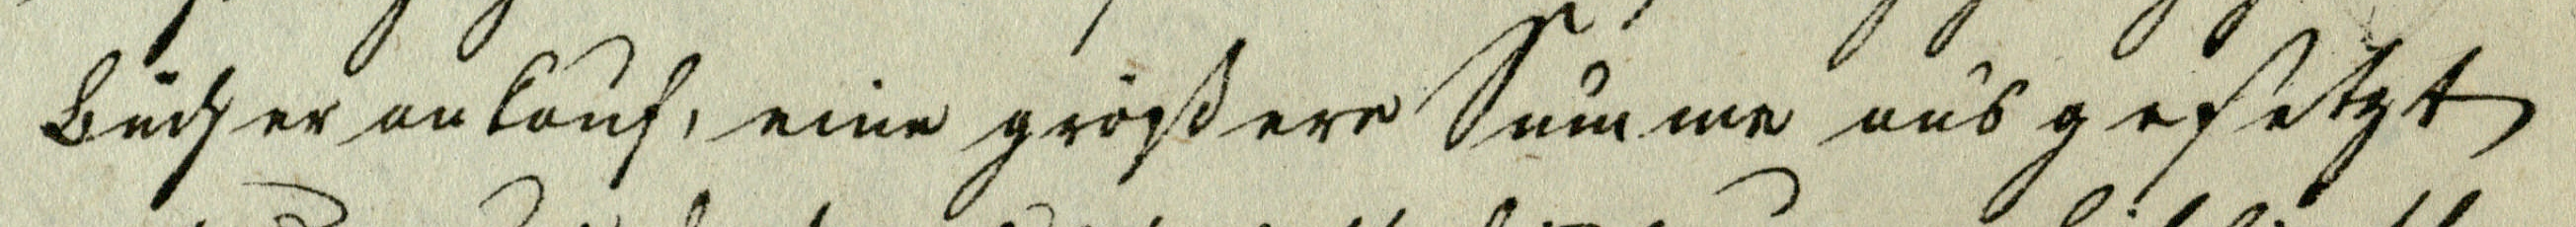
Bücherankauf, eine größere Summe ausgesetzt
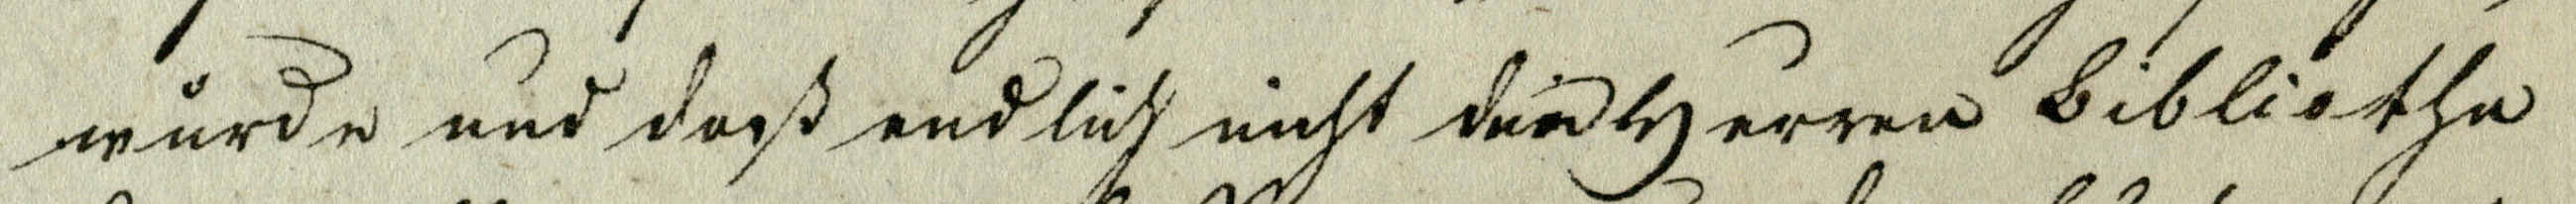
würde und daß endlich nicht den Herren Bibliothe¬
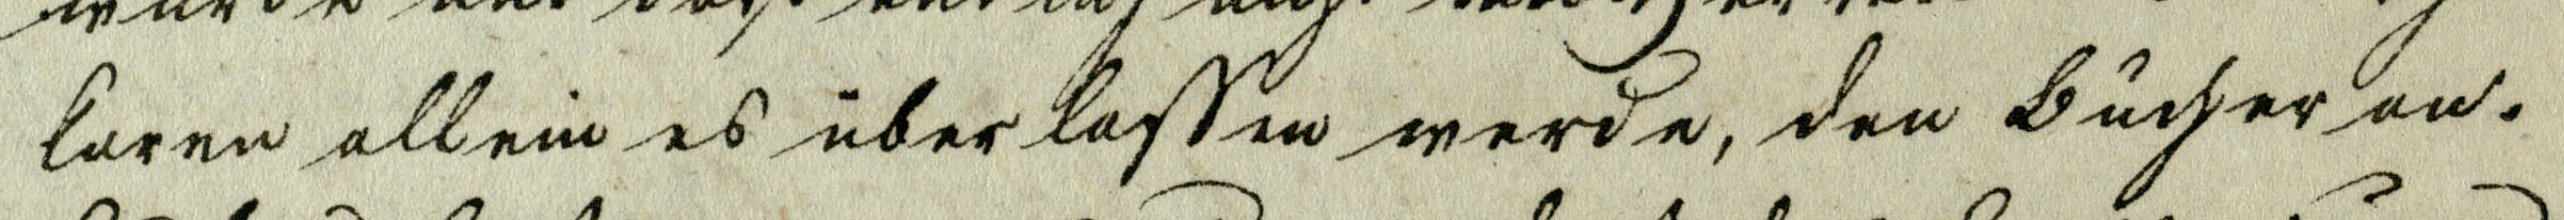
karen allein es überlassen werde, den Bücheran¬
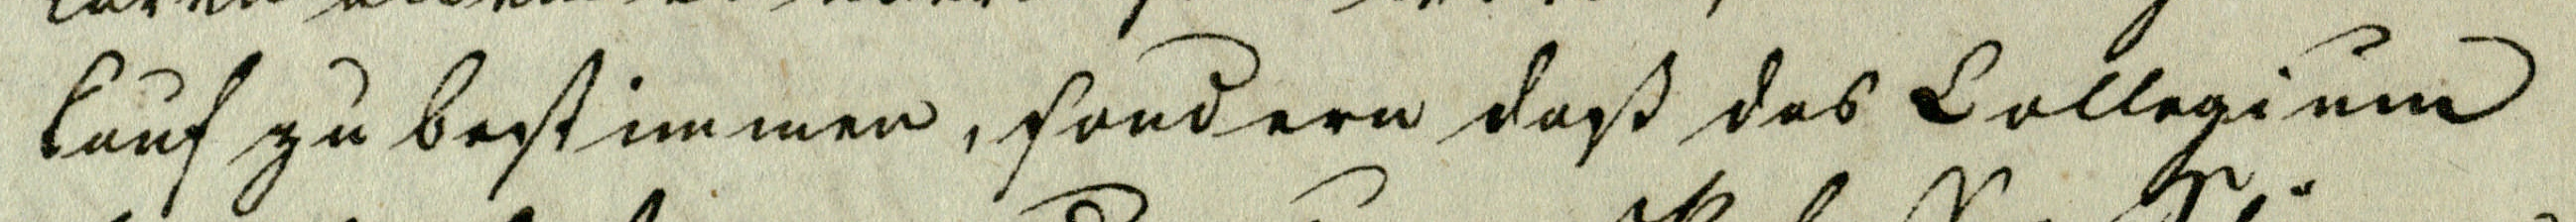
kauf zu bestimmen, sondern daß das Collegium
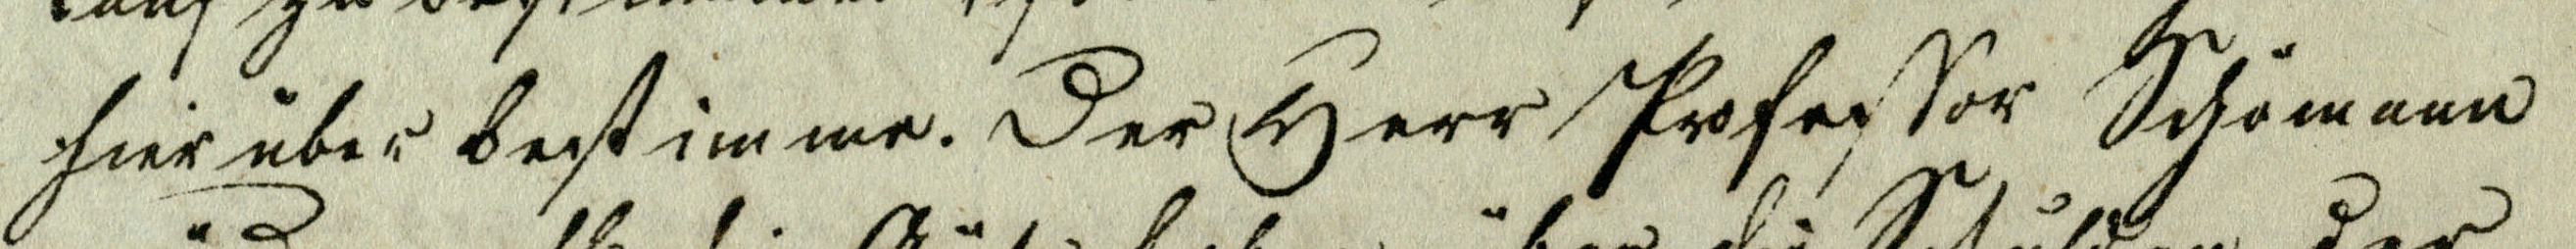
hierüber bestimme. Der Herr Professor Schömann
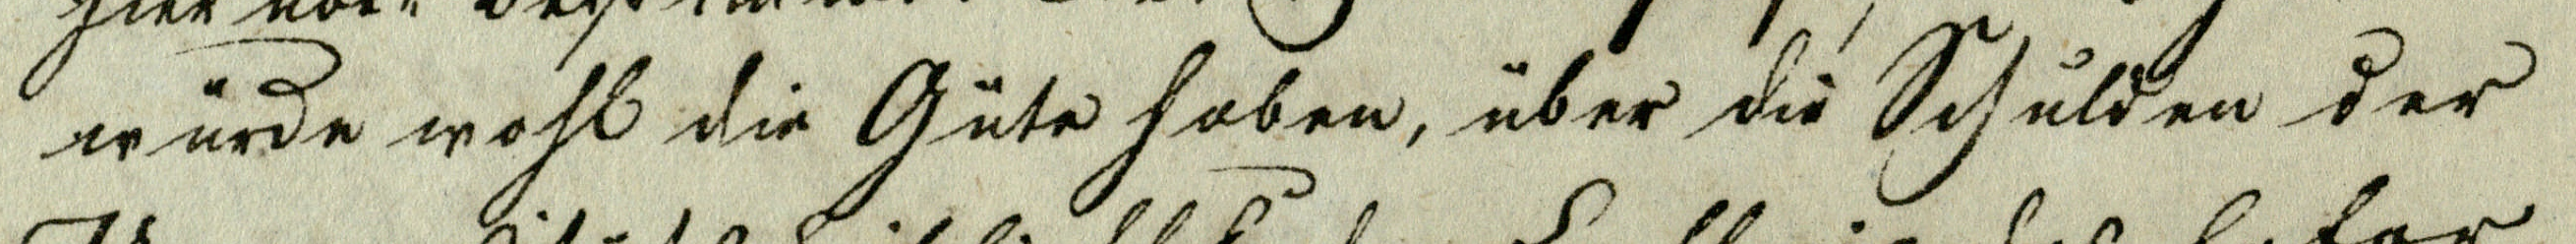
würde wohl die Güte haben, über die Schulden der
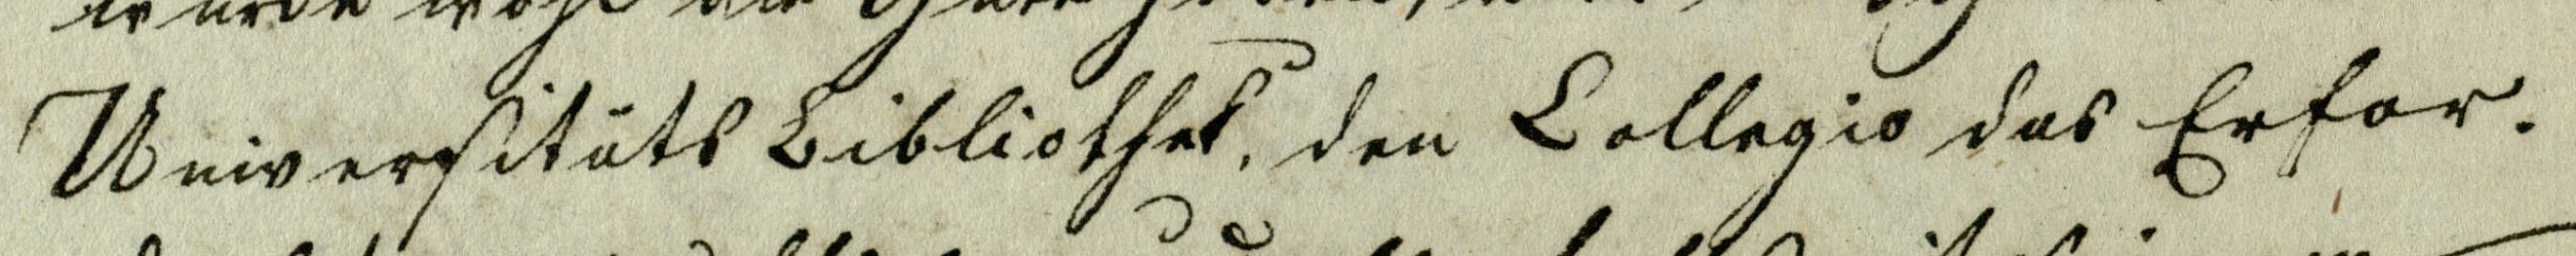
Universitäts Bibliothek, den Collegio das Erfor¬
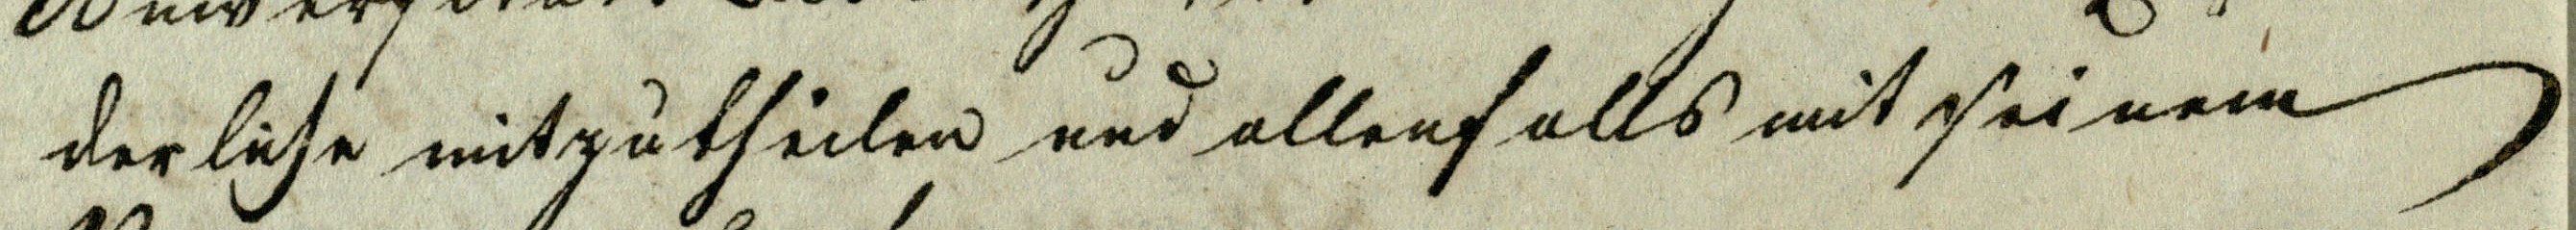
derliche mitzutheilen und allenfalls mit seinem
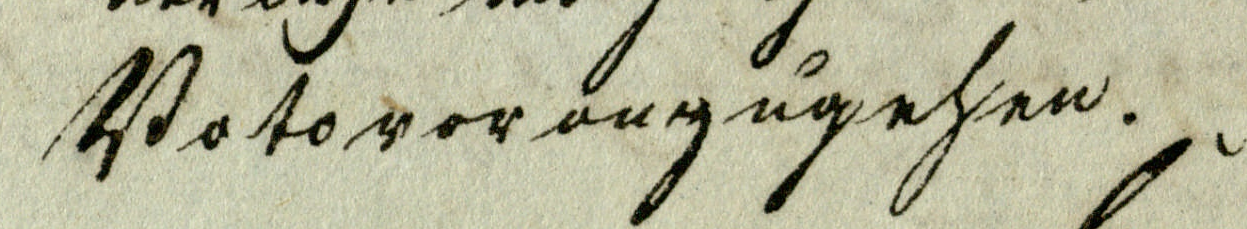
Voto voranzugehen.
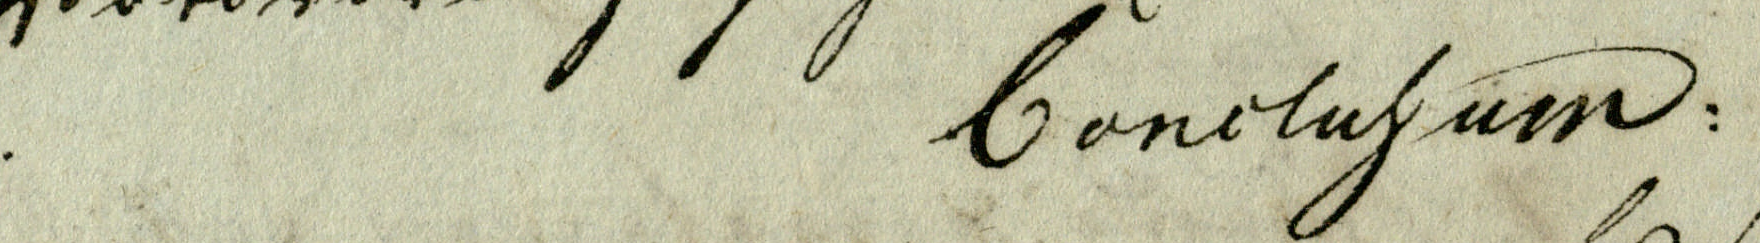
Conclusum:
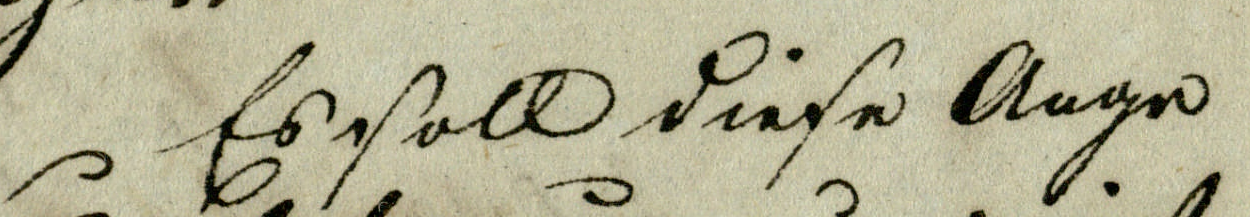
Es soll diese Ange¬
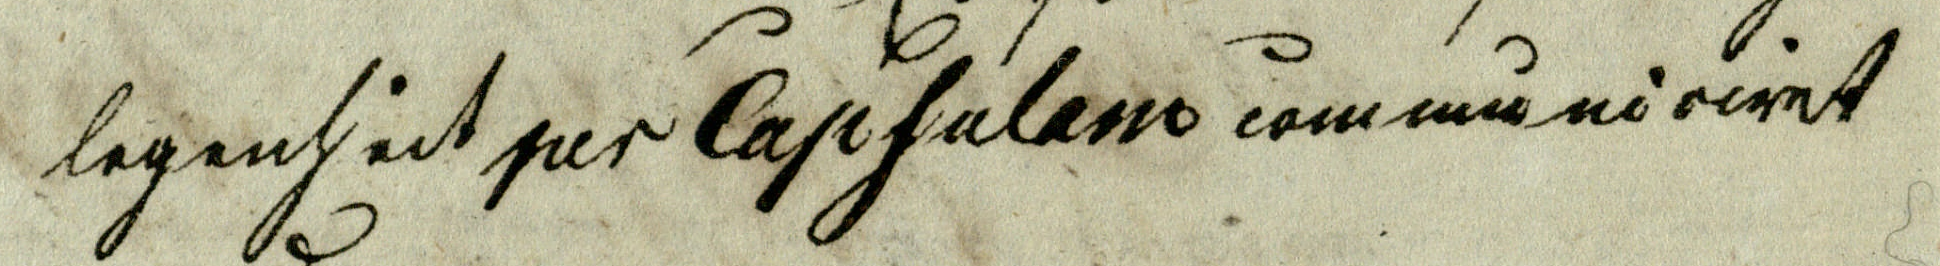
legenheit per Capsulam communiciret
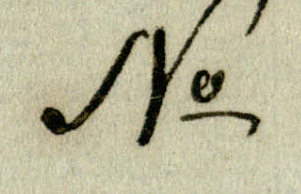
Nº
